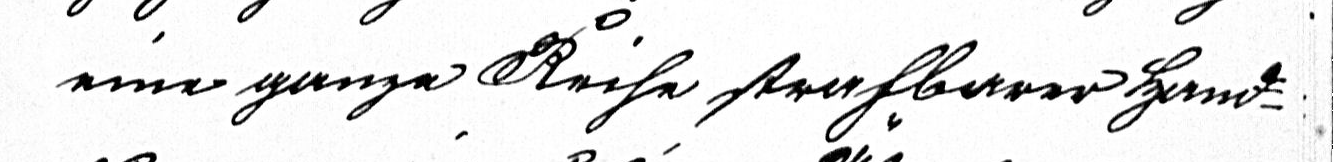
eine ganze Reise strafbarer Hand¬
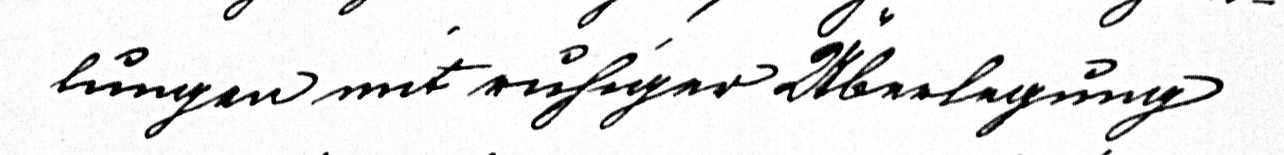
lungen mit ruhiger Überlegung
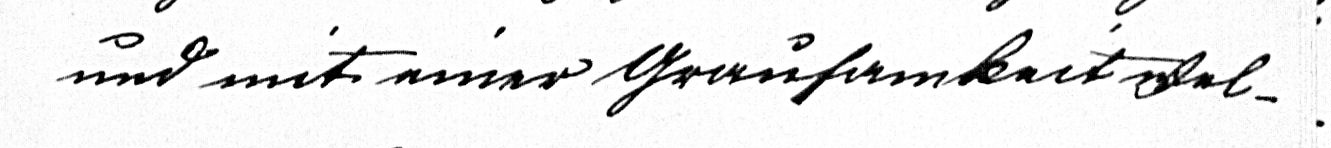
und mit einer Grausamkeit wel¬
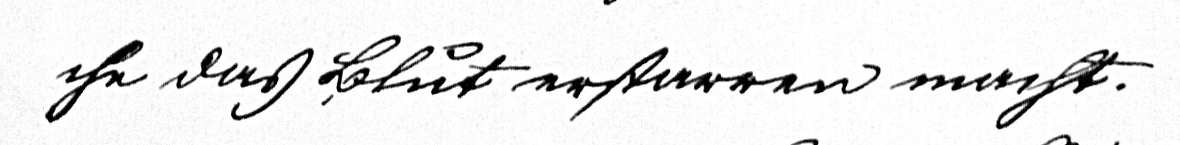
che das Blut erstarren macht.
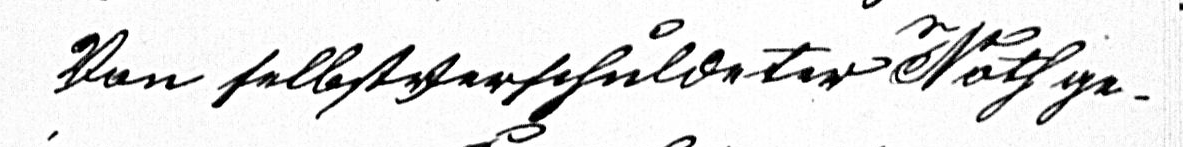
Von selbstverschuldeter Noth ge¬
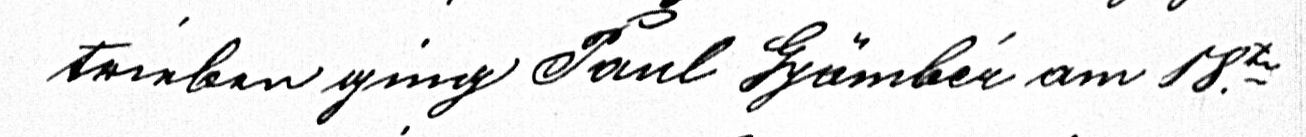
trieben ging Paul Gyömbér am 18te
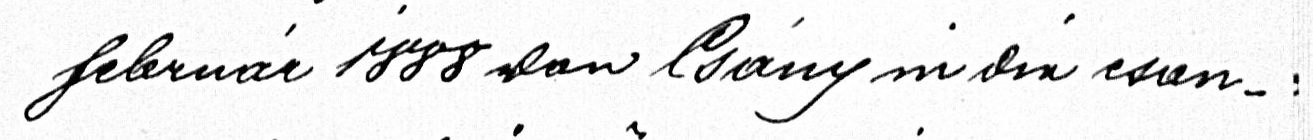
Február 1888 von Csány in die cson¬
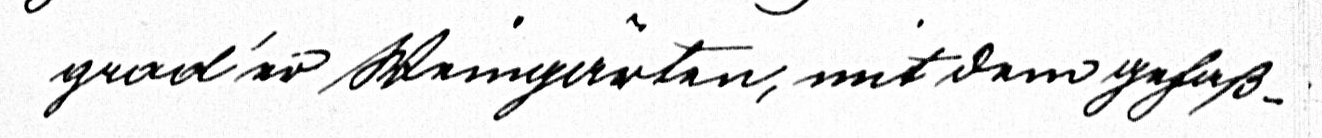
grad'er Weingärten, mit dem gefaß¬
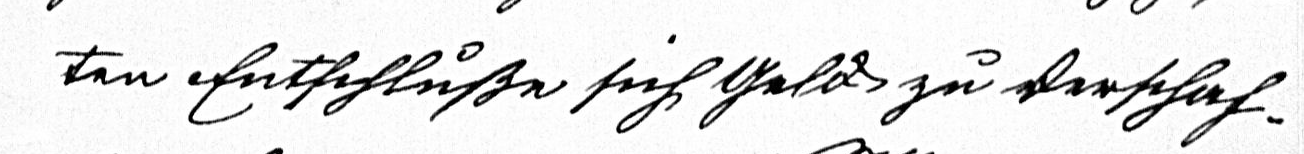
ten Entschluße sich Geld zu verschaf¬
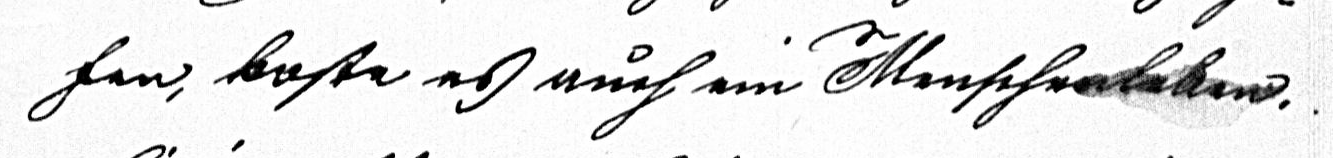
fen, beste es auch im Menschenleben.
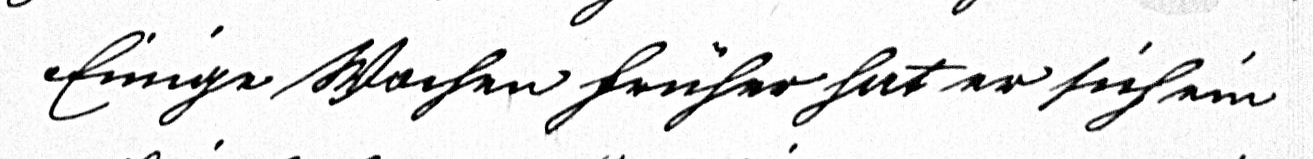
Einige Wachen früher hat er sich im
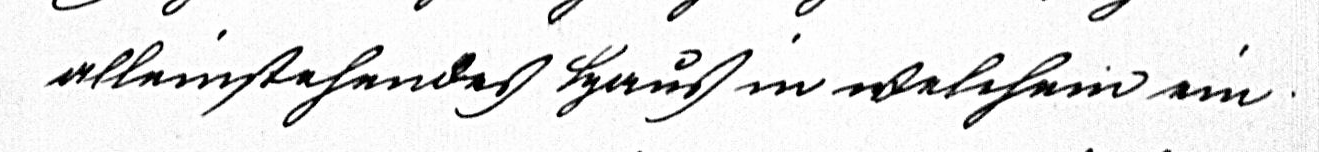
alleinstehendes Haus in welchem im
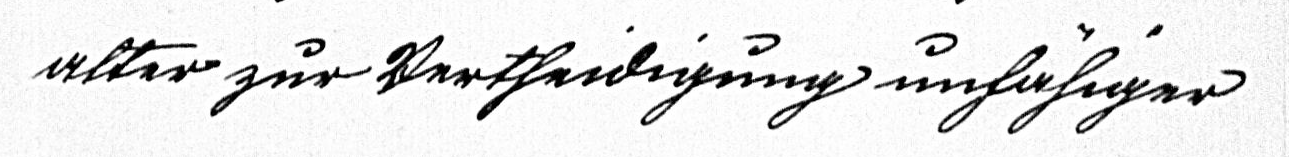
alter zur Vertheidigung unfähiger
